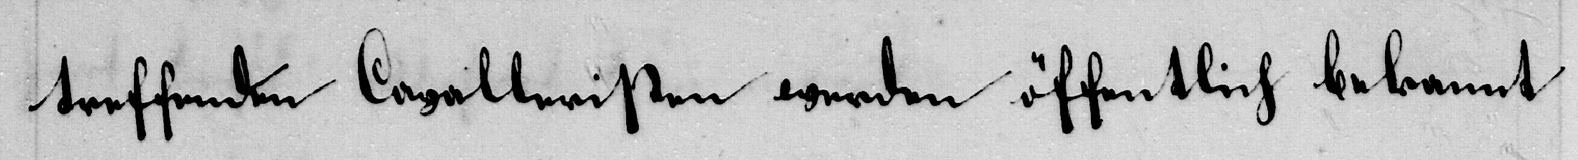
treffenden Cavalleristen werden öffentlich bekannt
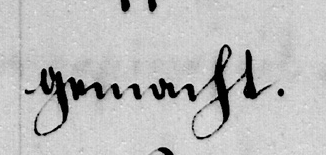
gemacht.
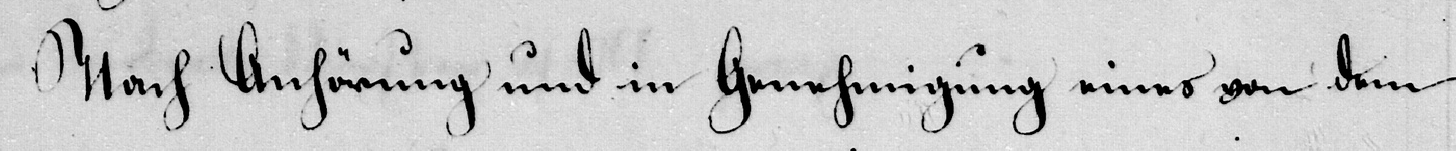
Nach Anhörung und in Genehmigung eines von dem
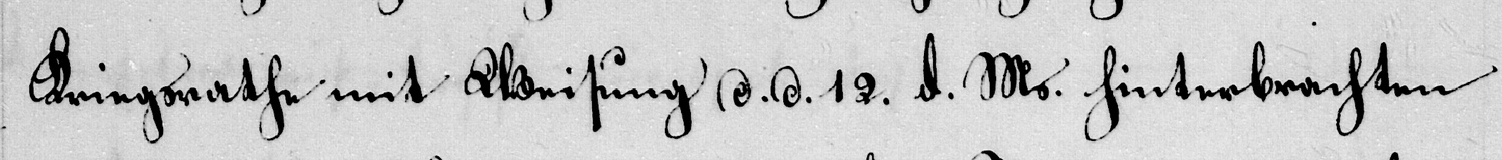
Kriegsrathe mit Weisung d. d. 12. d. Ms. hinterbrachten
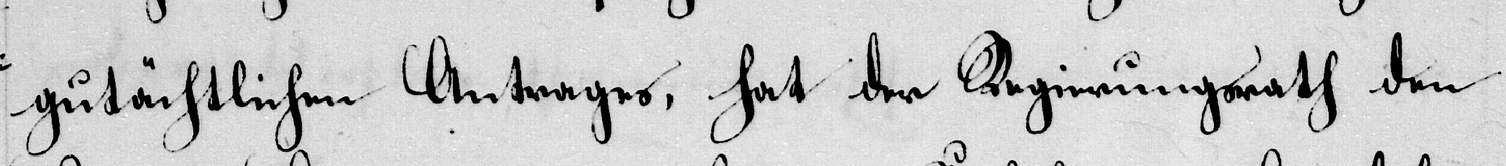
gutächtlichen Antrages, hat der Regierungsrath den
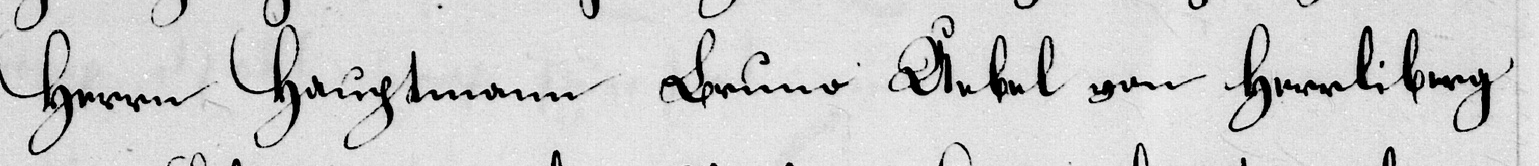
Herrn Hauptmann Bruno Uebel von Herrliberg
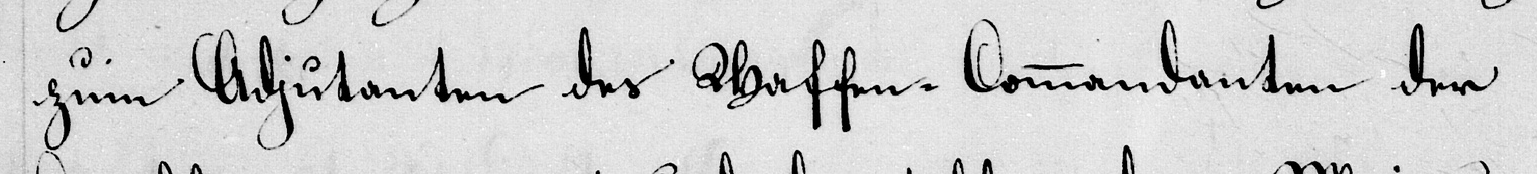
zum Adjutanten des Waffen-Commandanten der
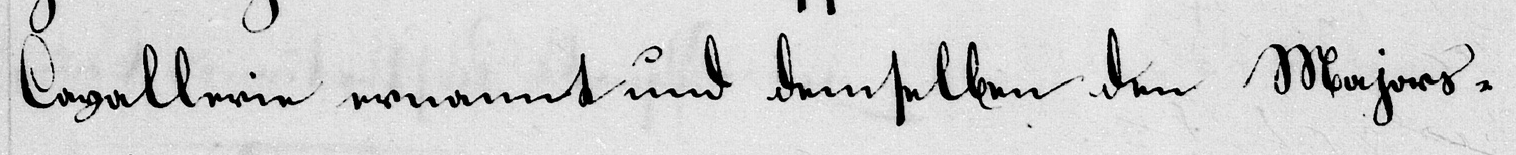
Cavallerie ernannt und demselben den Majors¬
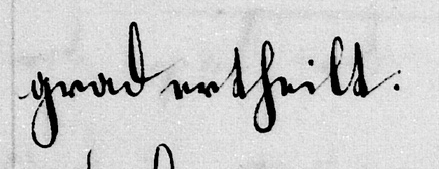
grad ertheilt.
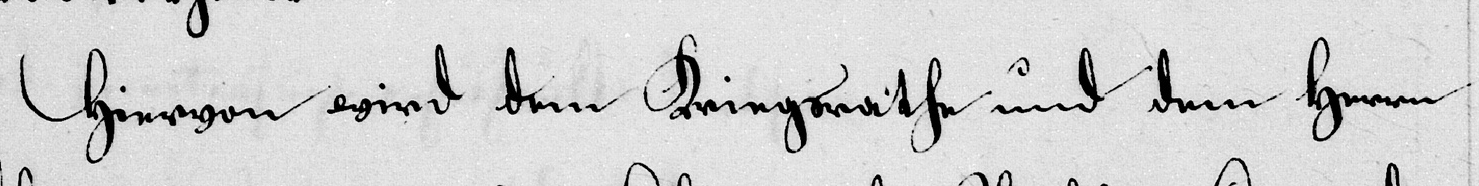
Hiervon wird dem Kriegsrathe und dem Herrn
